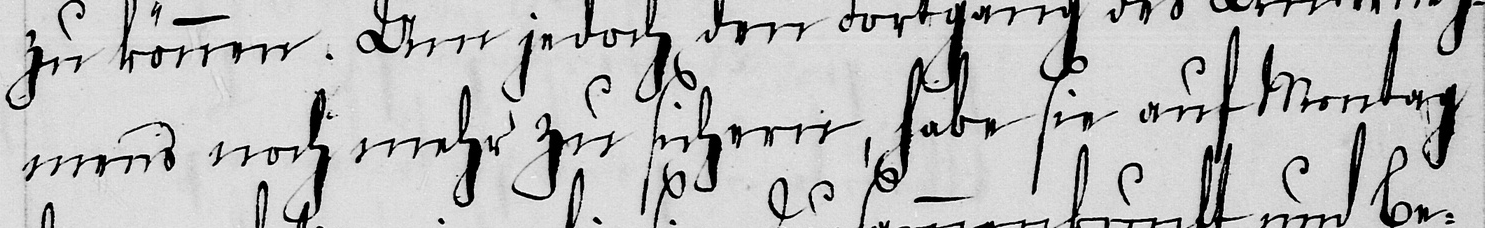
mens noch mehr zu sichern, habe sie auf Montag
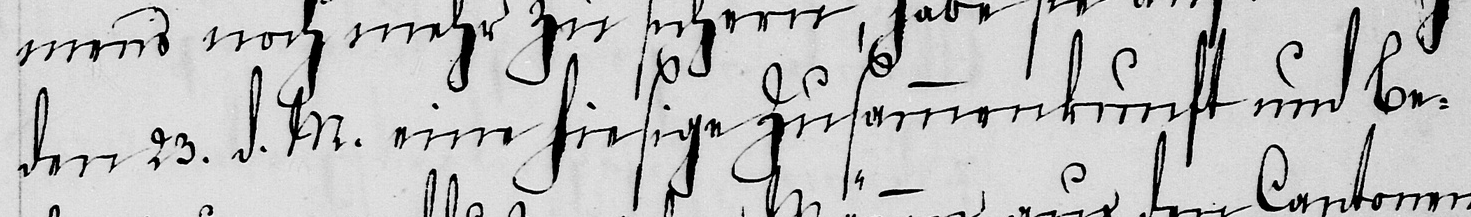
den 23. d. M. eine hiesige Zusammenkunft und Be¬
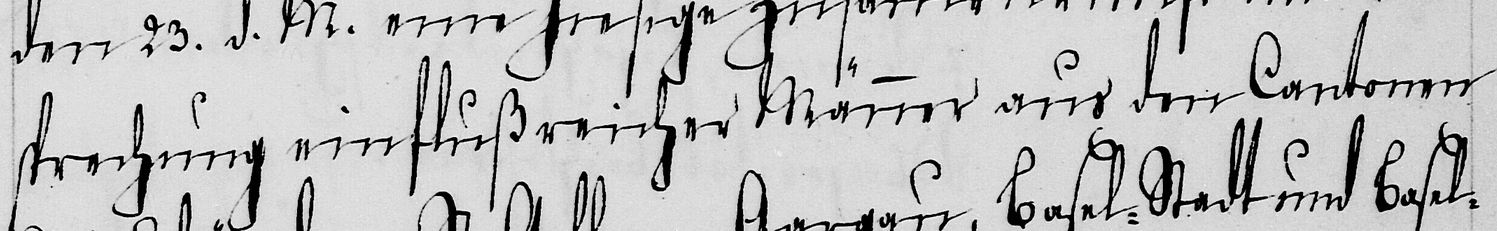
sprechung einflußreicher Männer aus den Cantonen
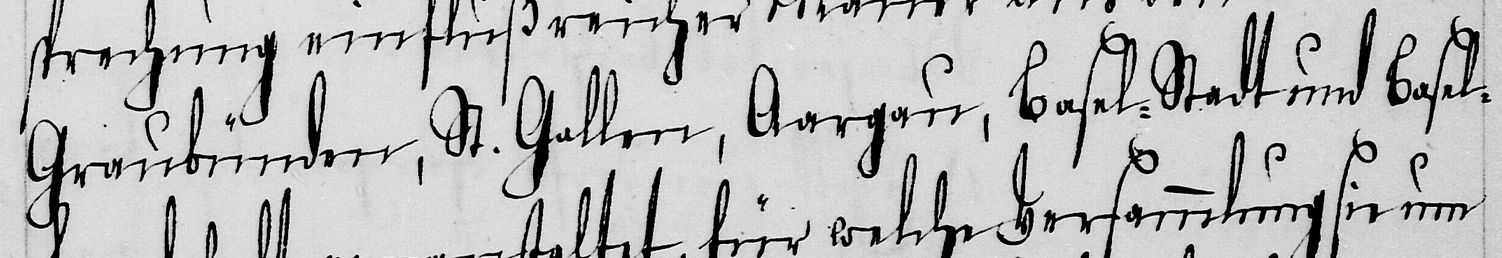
Graubünden, St. Gallen, Aargau, Basel-Stadt und Base¬
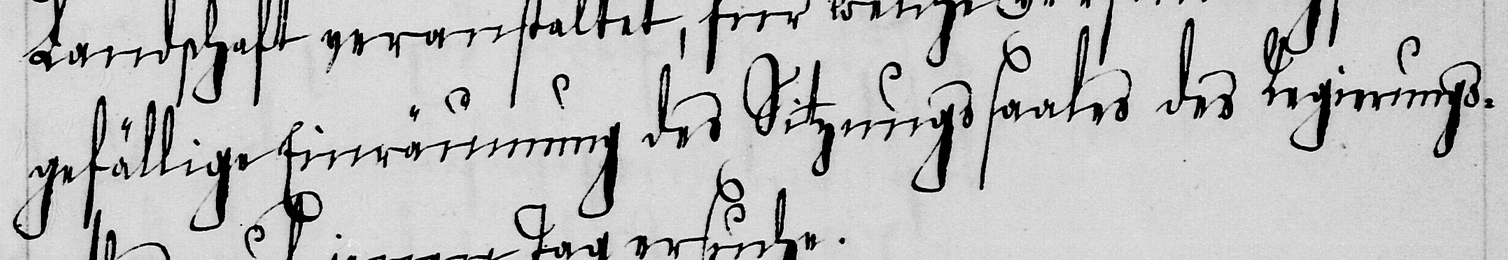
gefällige Einräumung des Sitzungssaales des Regierungs¬
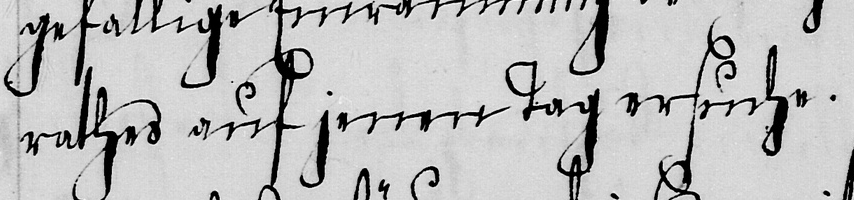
rathes auf jenen Tag ersuche.
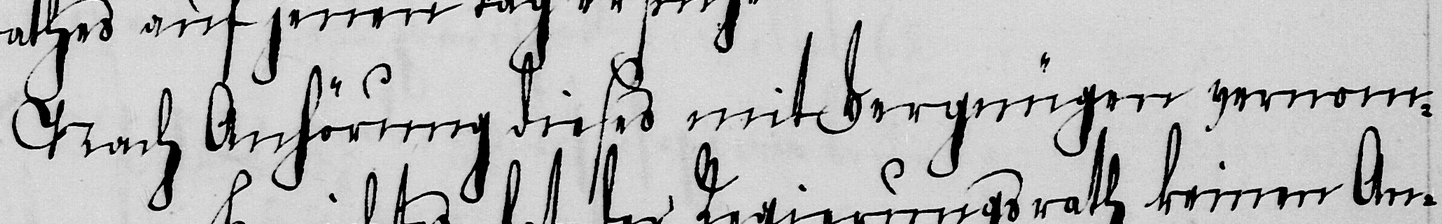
Nach Anhörung dieses mit Vergnügen vernom¬
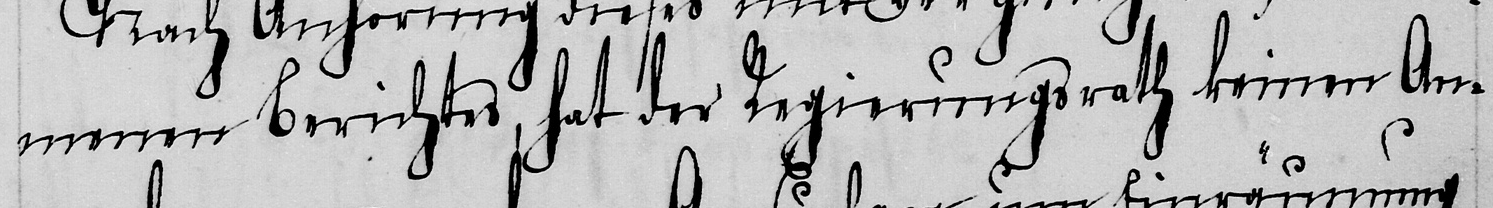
menen Berichtes, hat der Regierungsrath keinen An¬
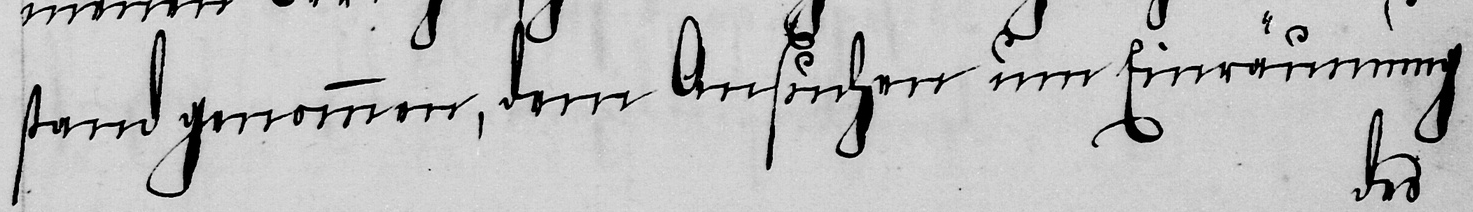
stand genommen, dem Ansuchen um Einräumung
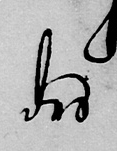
der
